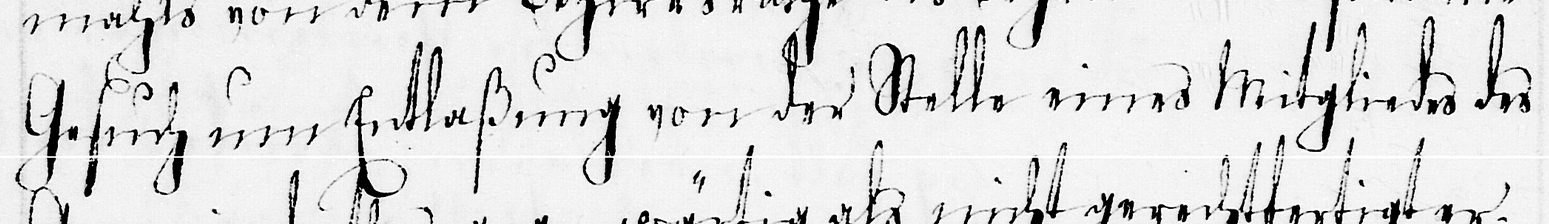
Gesuch um Entlaßung von der Stelle eines Mitgliedes des
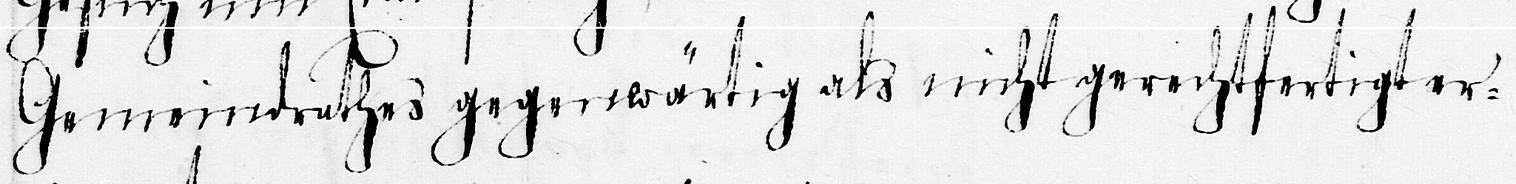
Gemeindrathes gegenwärtig als nicht gerechtfertigt er¬
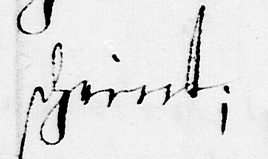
scheint;
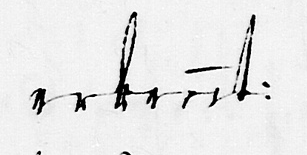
erkennt:
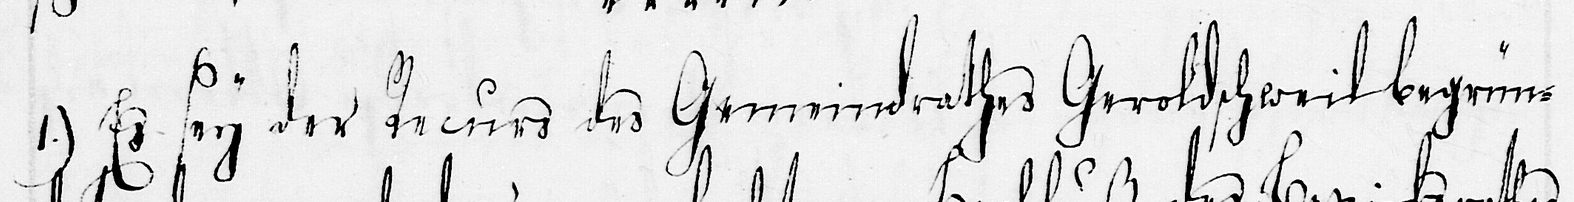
1.) Es sey der Recurs des Gemeindrathes Geroldschweil begrün¬
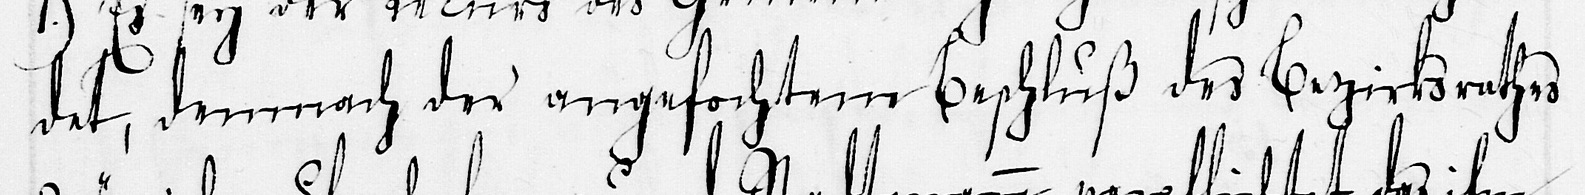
det, demnach der angefochtene Beschluß des Bezirksrathes
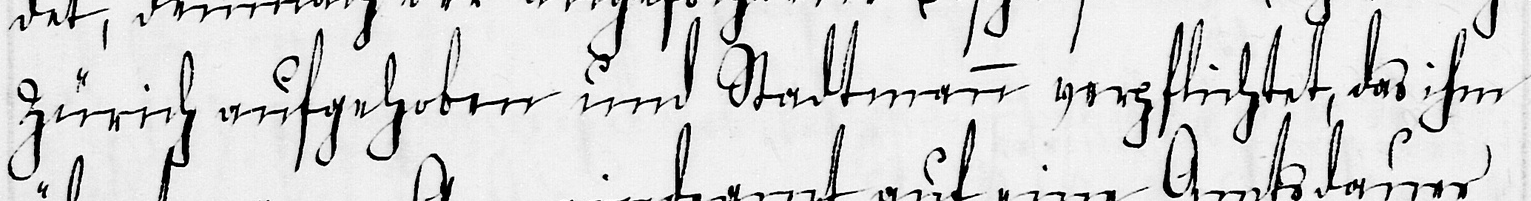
Zürich aufgehoben und Stadtmann verpflichtet, das ihm
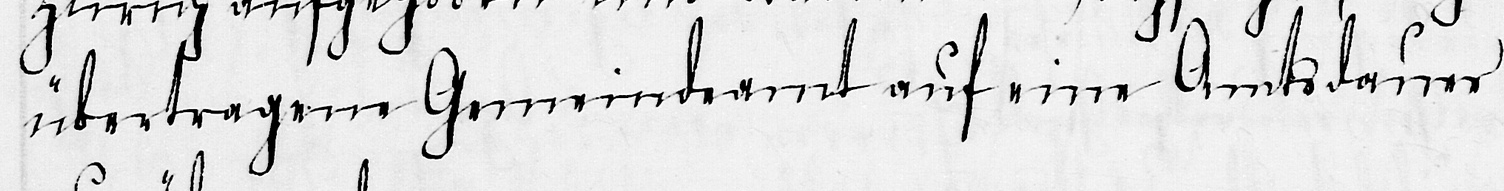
übertragene Gemeindeamt auf eine Amtsdauer
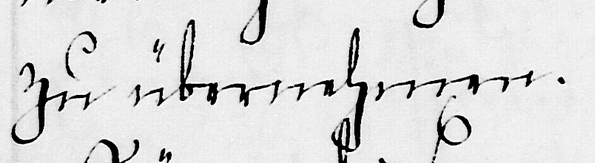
zu übernehmen.
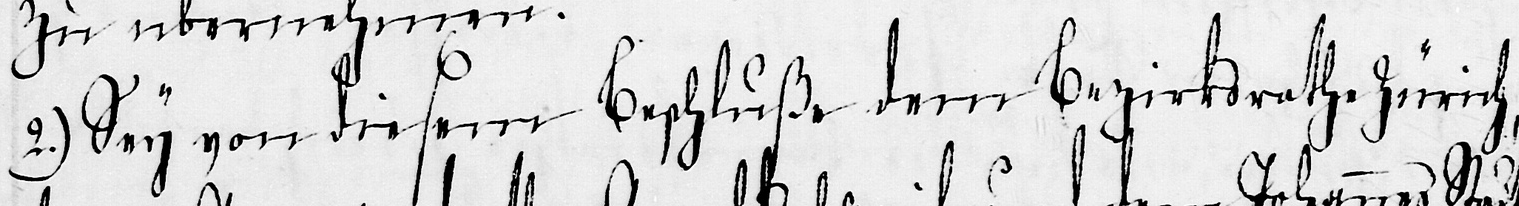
2.) Sey von diesem Beschluße dem Bezirksrathe Züric¬
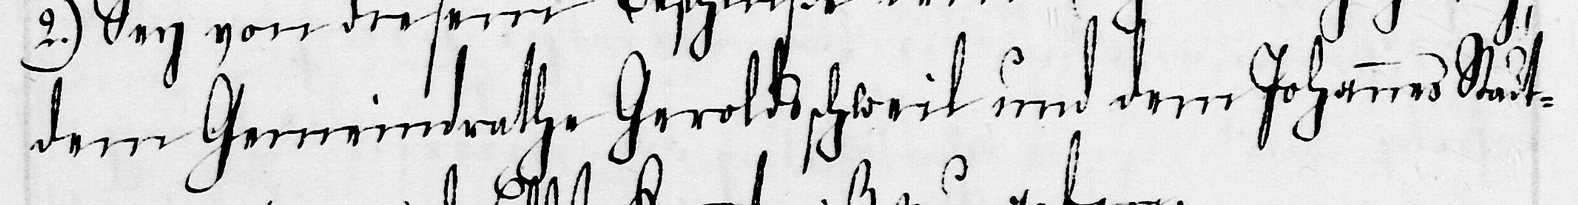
dem Gemeindrathe Geroldschweil und dem Johannes Stad¬
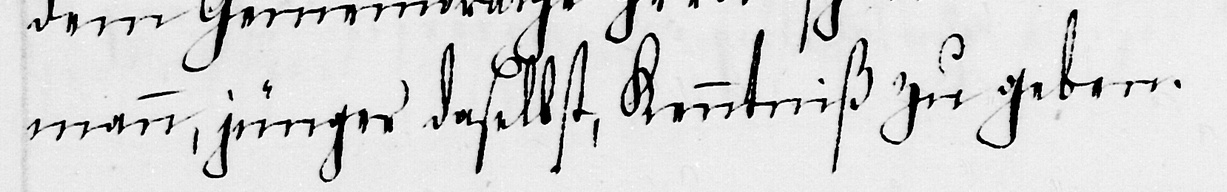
tmann, jünger daselbst, Kenntniß zu geben.
